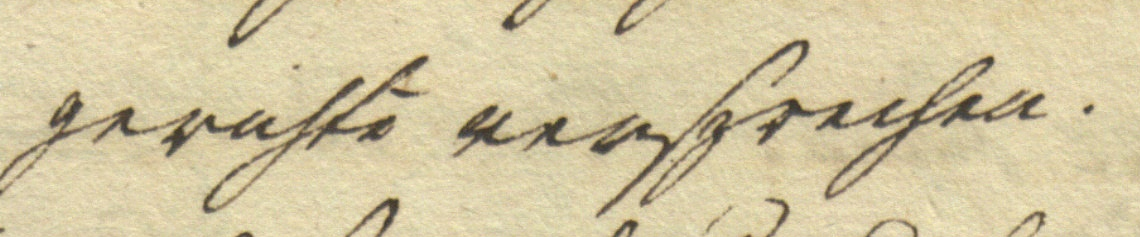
gerichte versprechen.
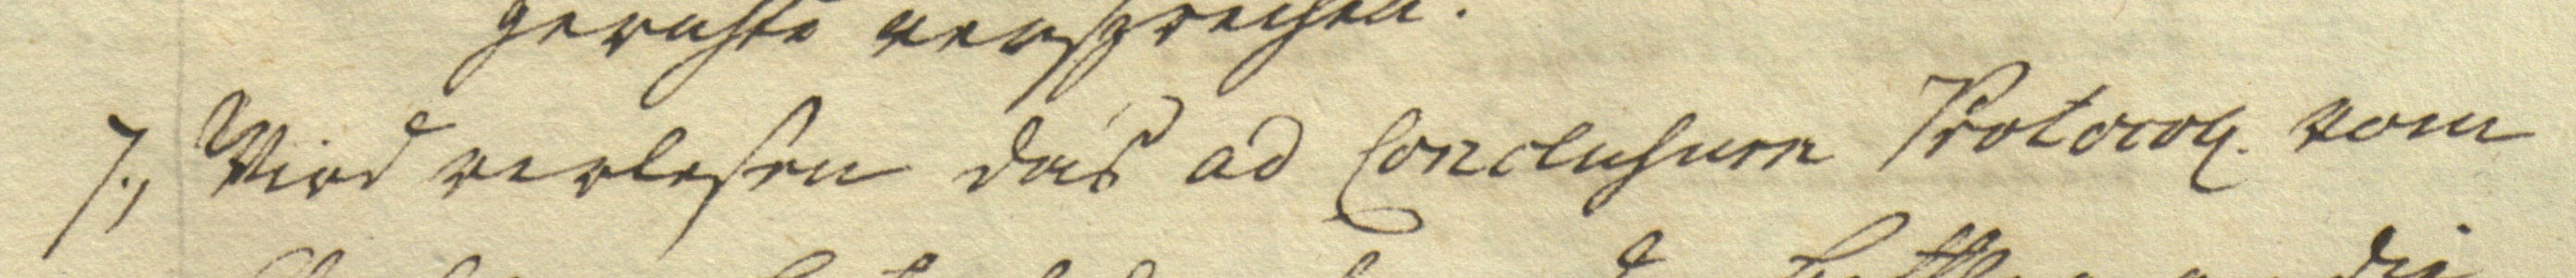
7. Wird verlesen das ad Conclusum Protocoll. vom
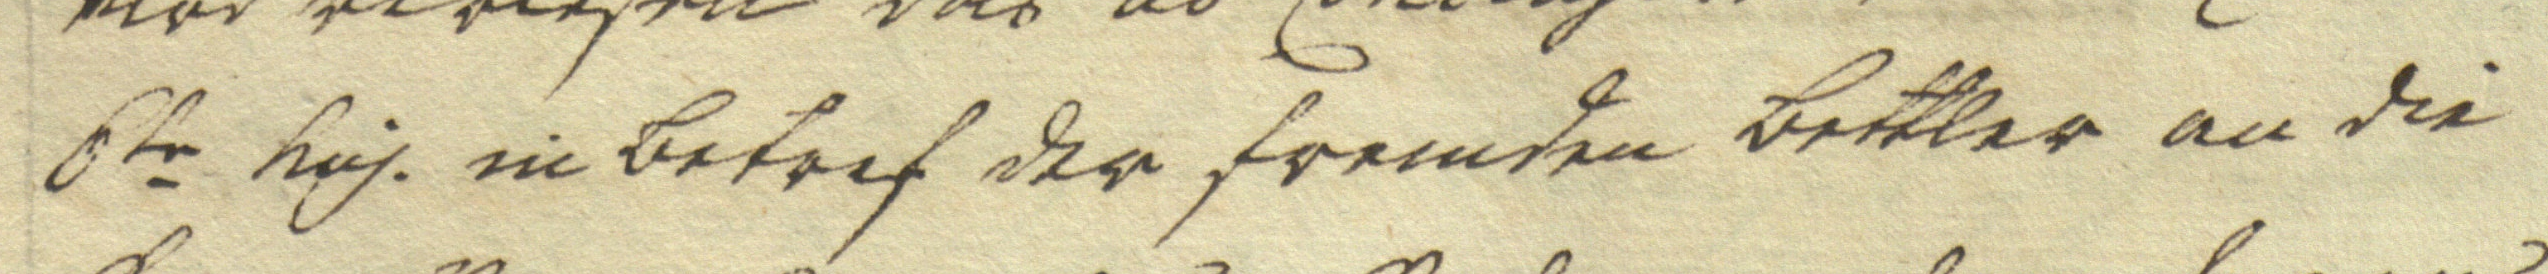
6 te huj. in Betref der fremden Bettler an die
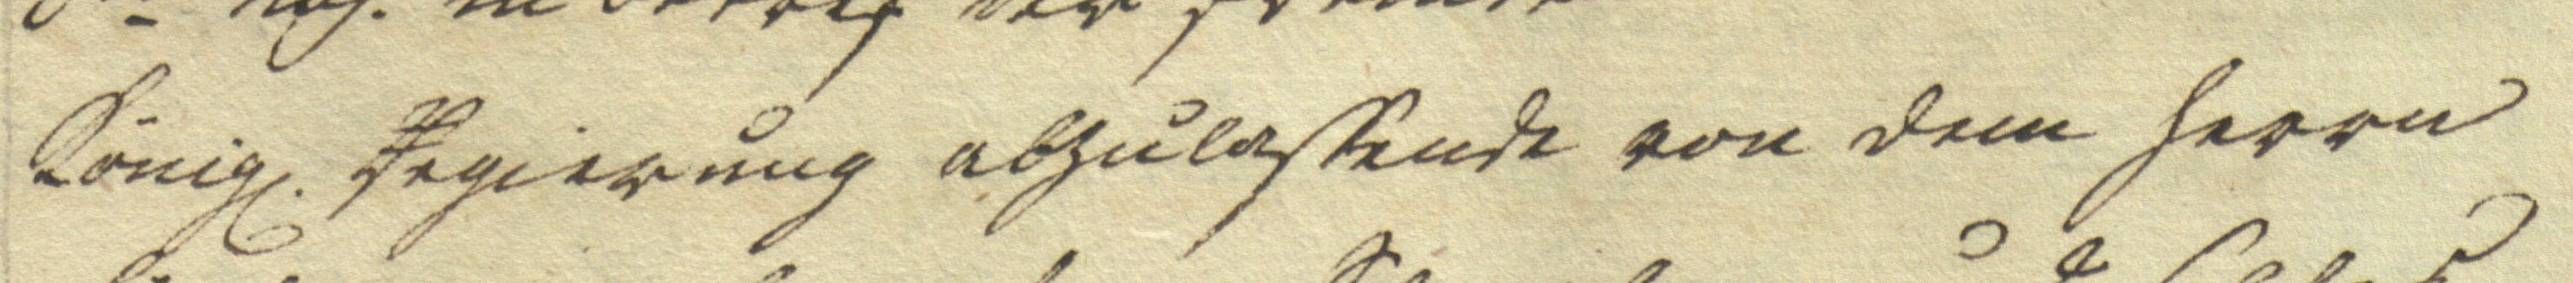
Königl. Regierung abzulassende von dem Herrn
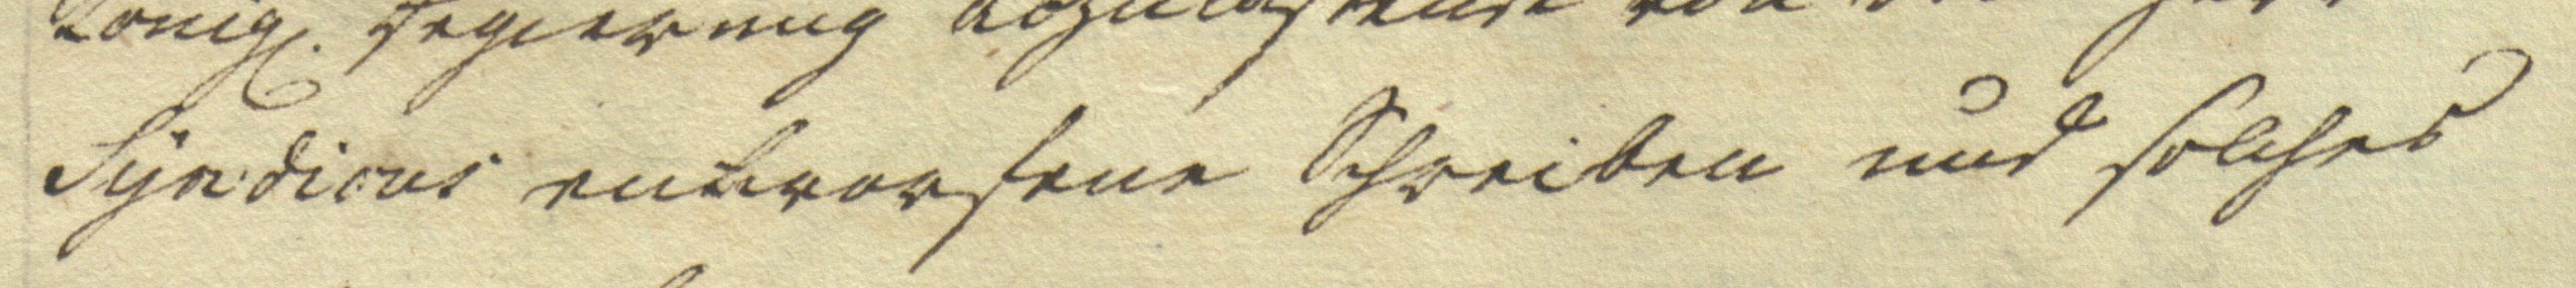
Sÿndicus entworfene Schreiben und solches
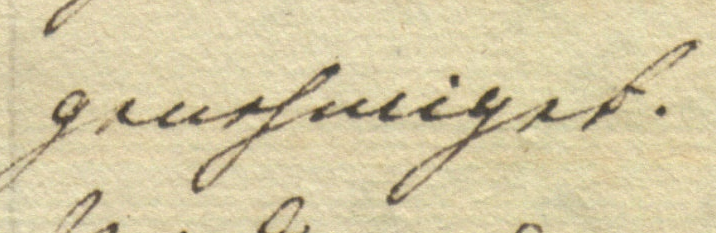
genehmiget.
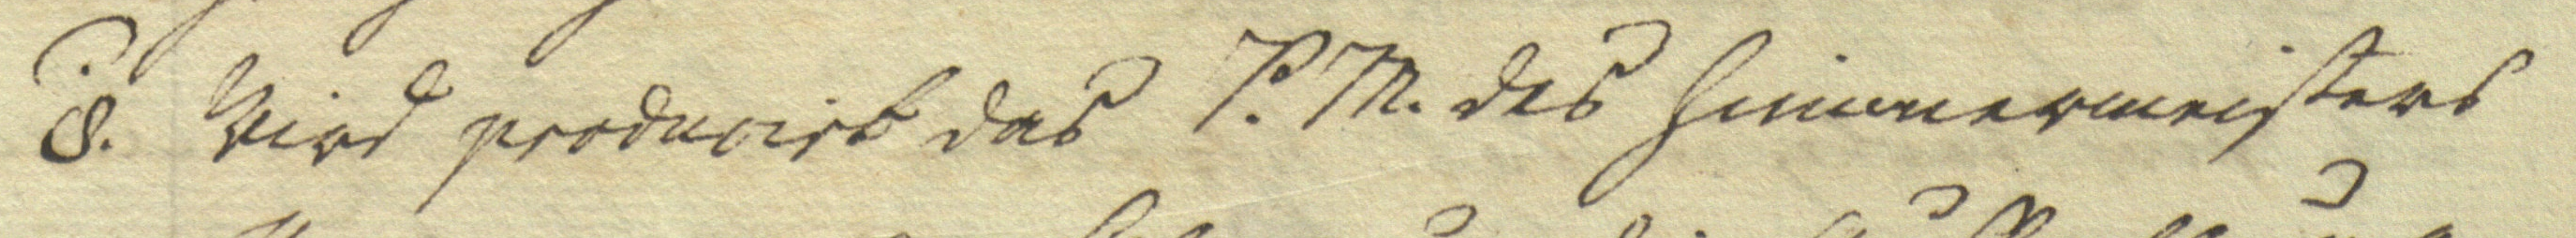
8. Wird producirt des P. M. des Zimmermeisters
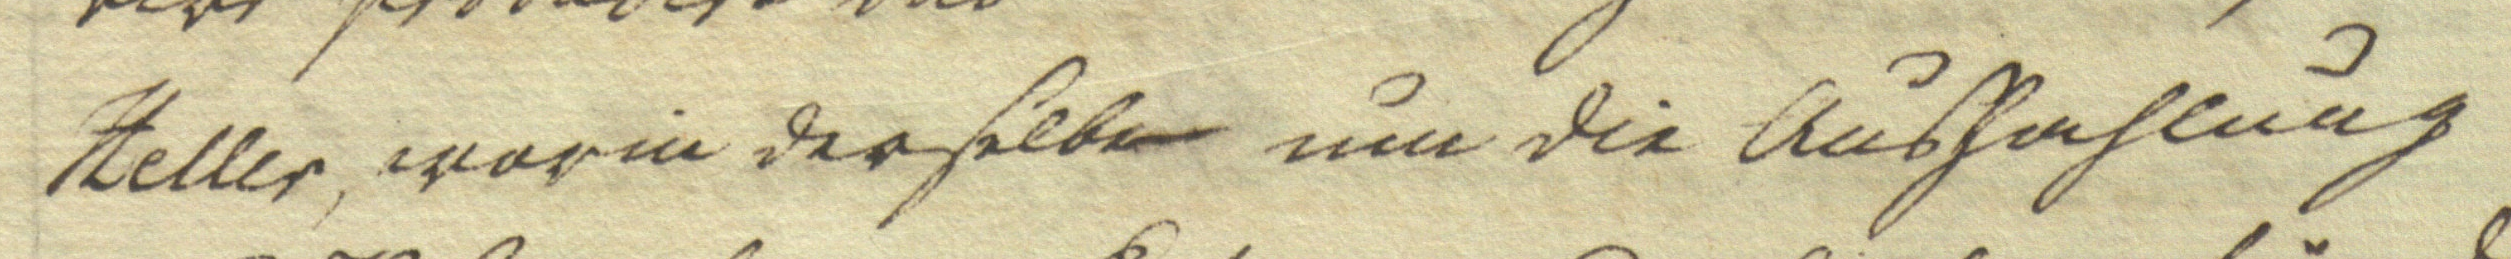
Heller, worin derselbe um die Auszahlung
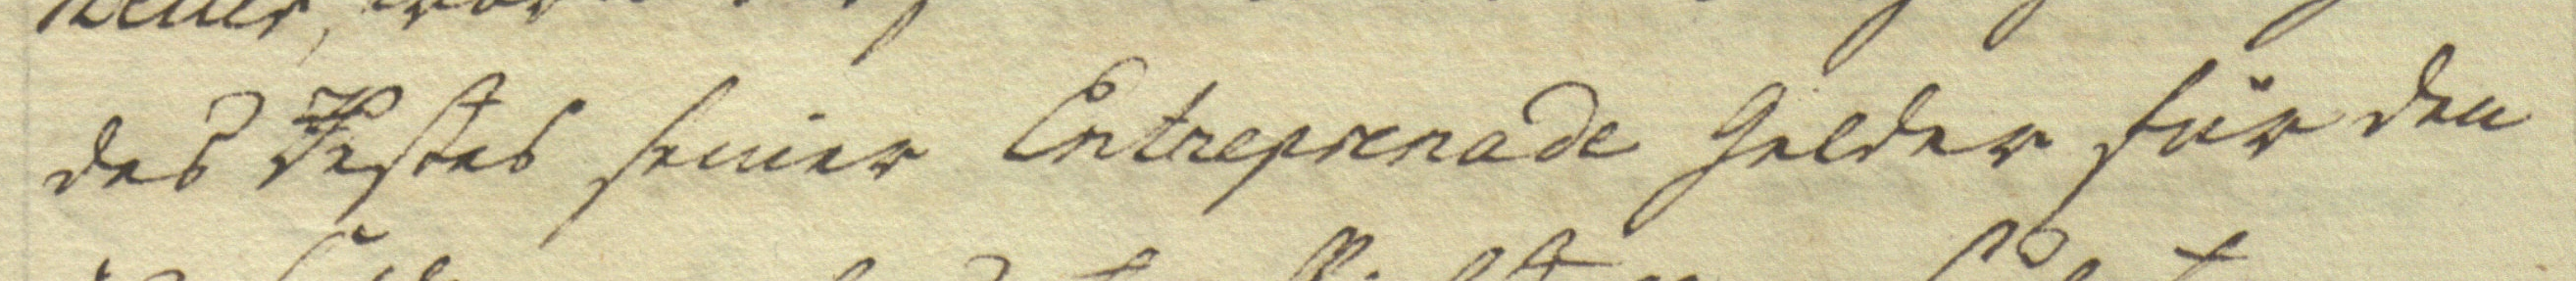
des Restes seiner Entreprenade Gelder für den
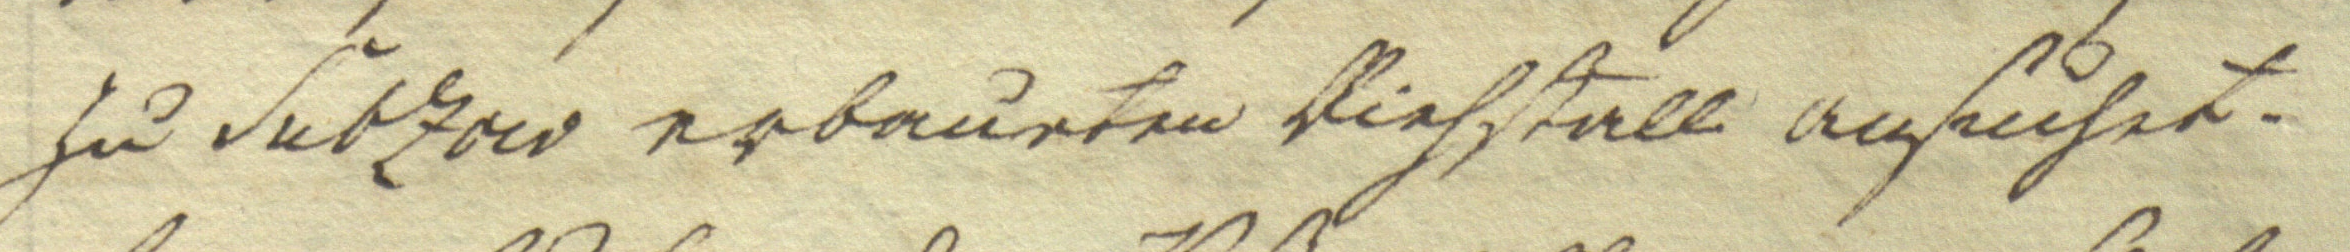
zu Subzow erbaueten Viehstall ansuchet.
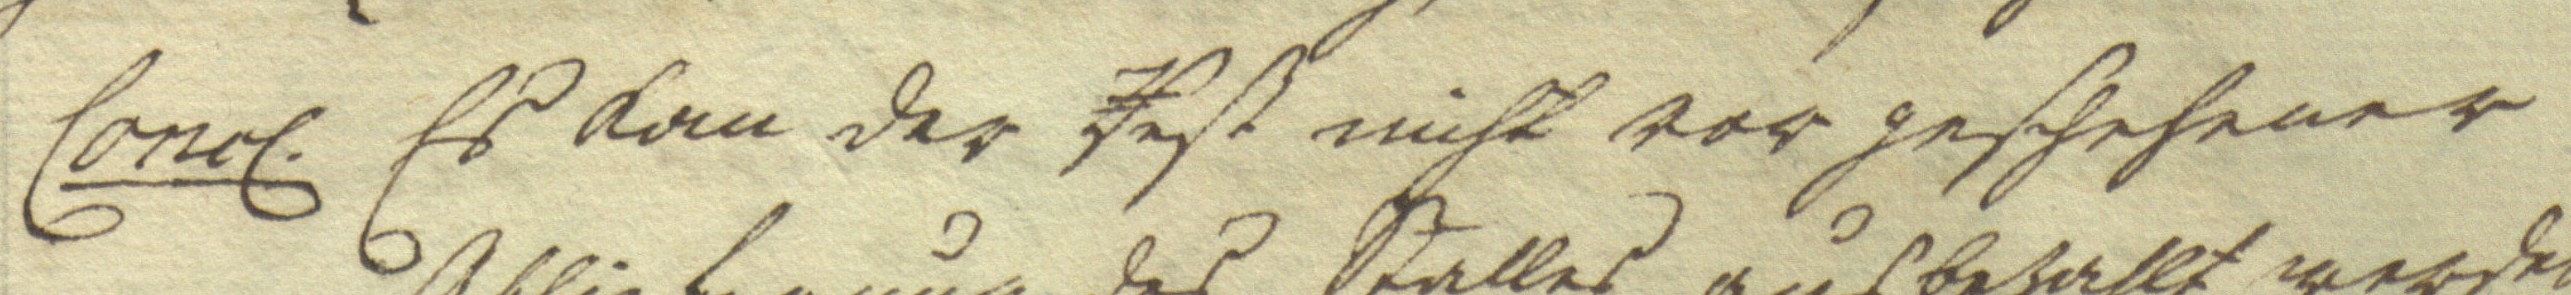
Concl. Es kan der Rest nicht vor geschehener
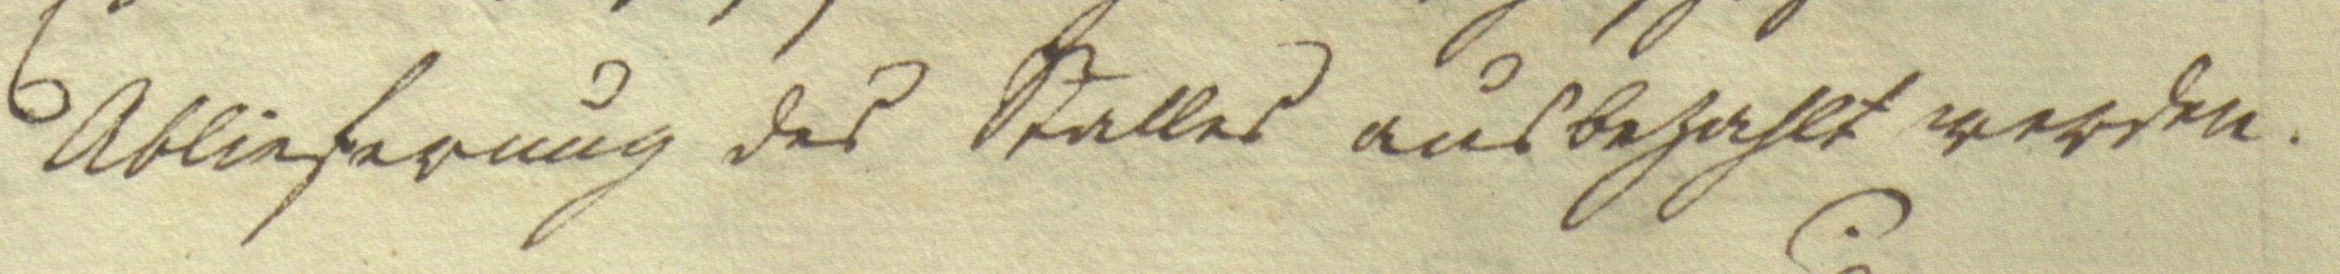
Ablieferung des Stalles ausbezahlt werden.
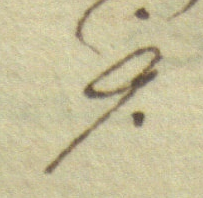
9.
